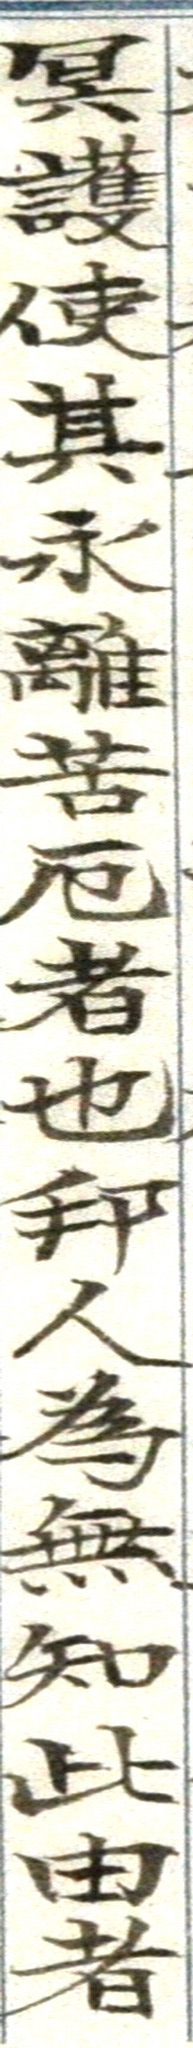冥護使其永離苦厄者也邦人為無知此由者
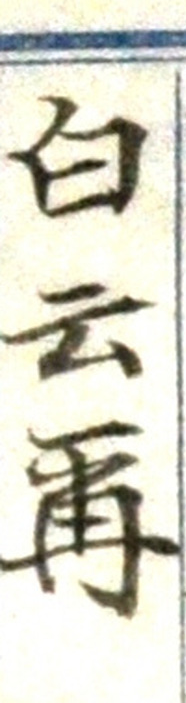白云爾
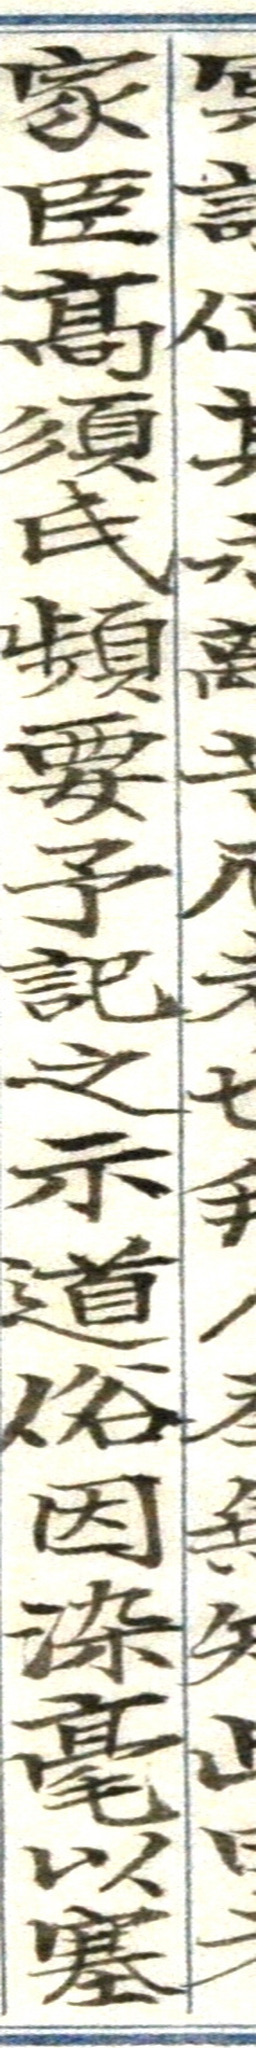家臣高須氏頻要予記之示道俗因染毫以塞
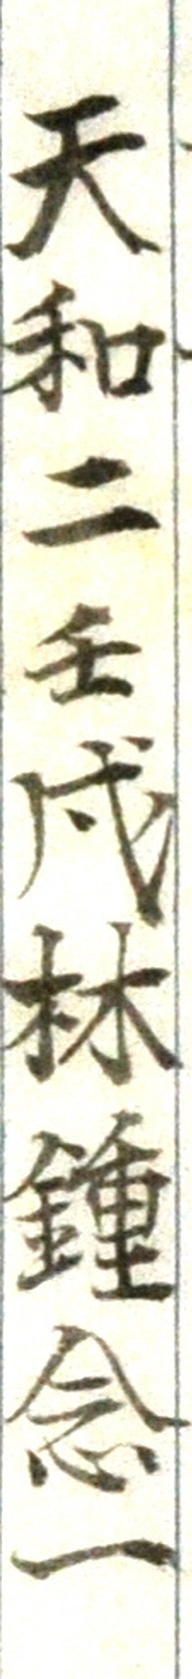天和二壬戌林鍾念一
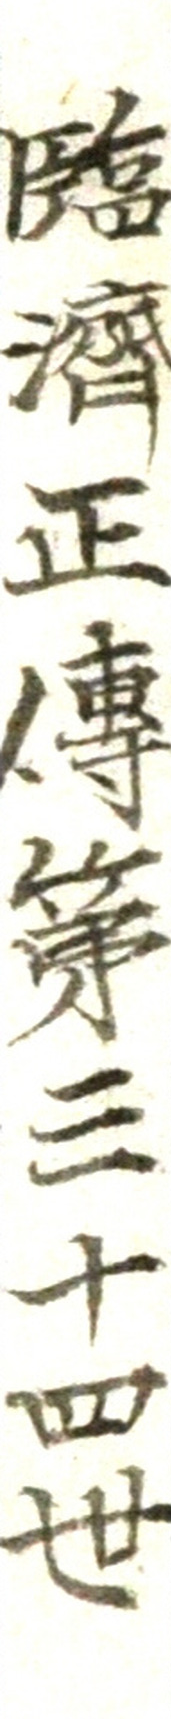臨済正伝第三十四世
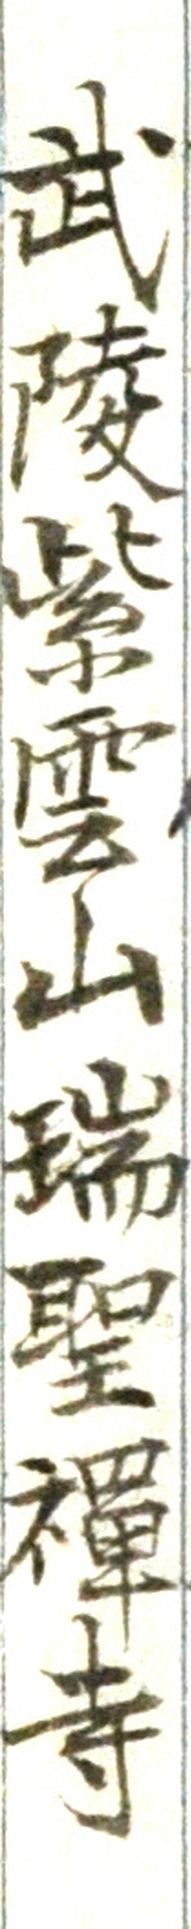武陵紫雲山瑞聖禅寺

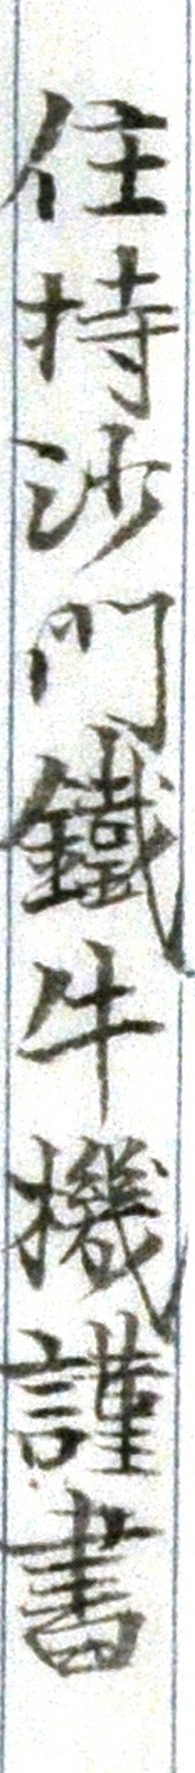住持沙門鉄牛機謹書
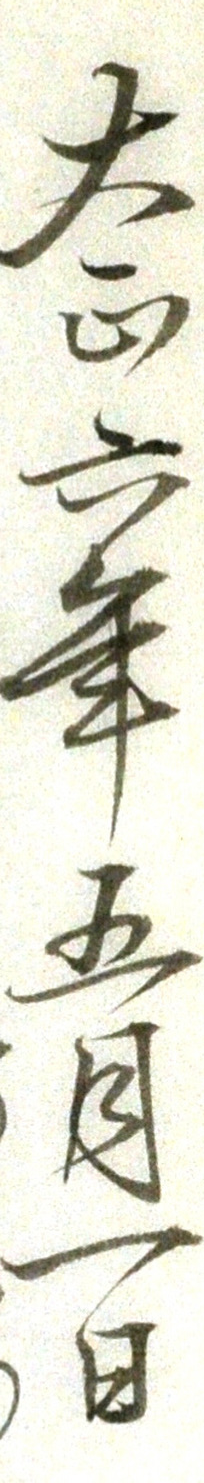大正六年五月一日
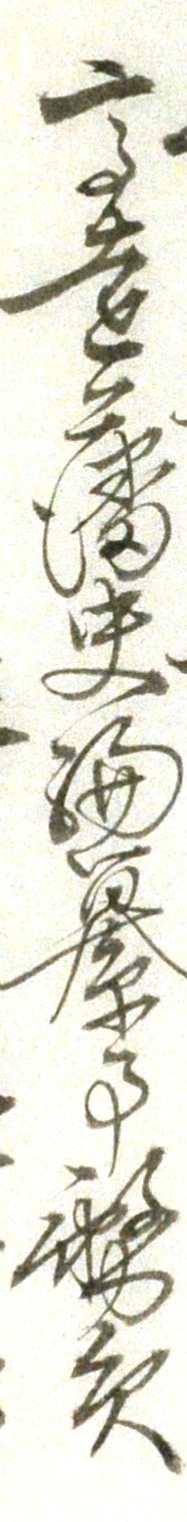高遠藩史編纂事務員
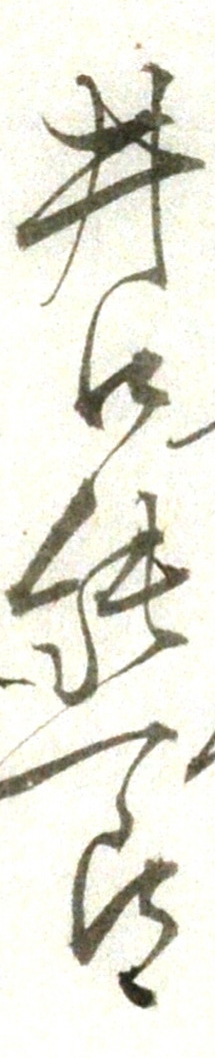井口純一郎

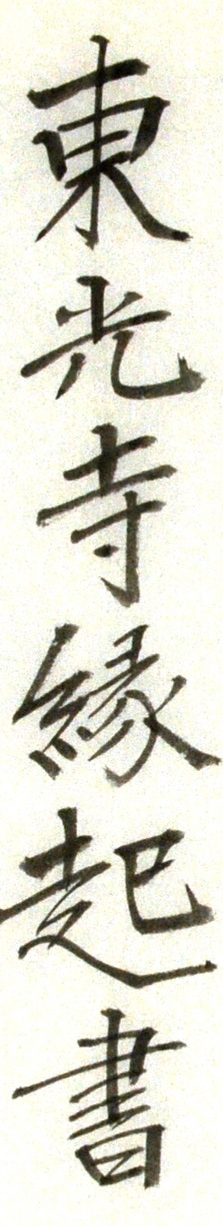東光寺縁起書
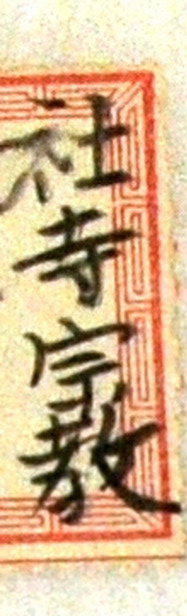社寺宗教
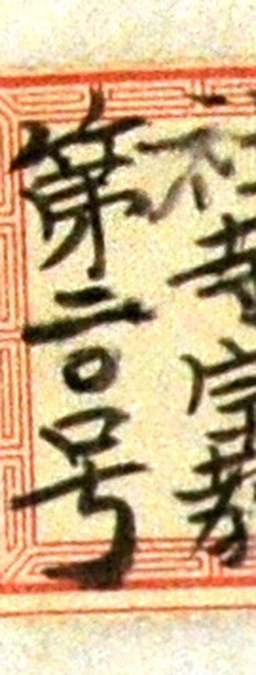第二〇号

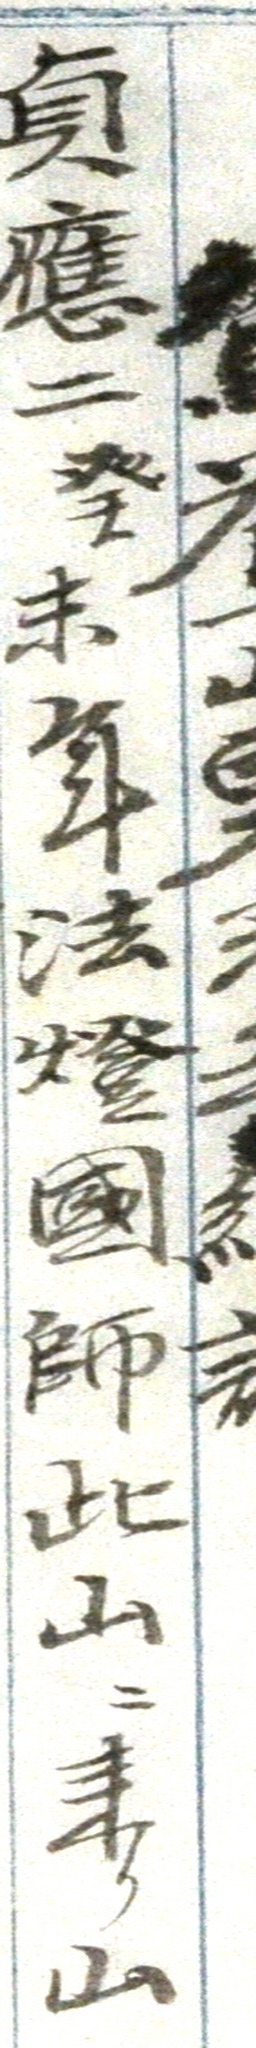貞応二癸未年法灯国師此山ニ来リ山
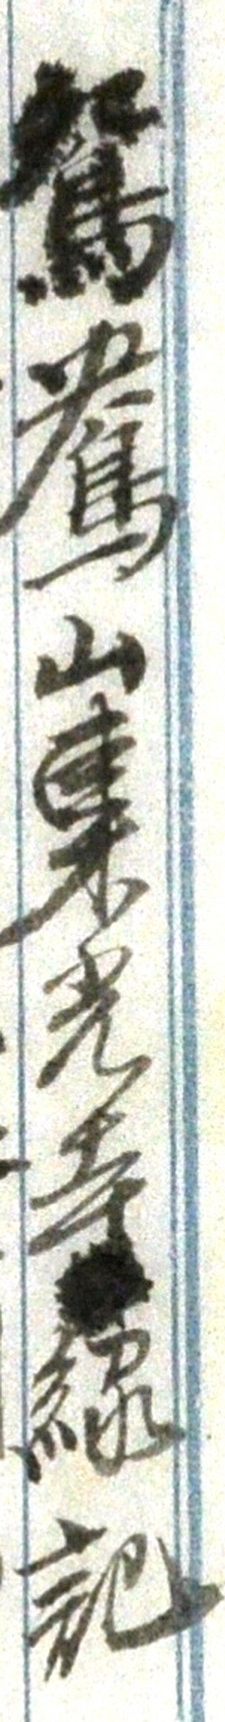鴛鴦山東光寺縁記
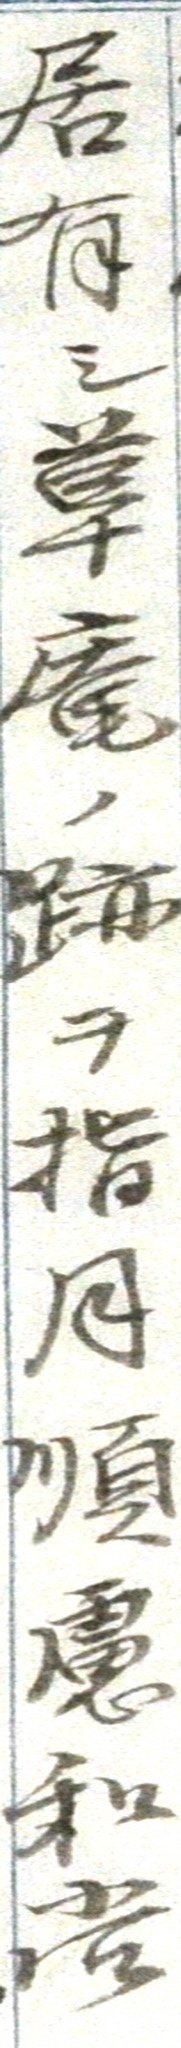居有シ草庵ノ跡ヲ指月順慮和尚
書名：桂泉院・樹林寺・東光寺縁起書、蓮華寺由来書、付夕顔観音記
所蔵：伊那市立高遠町図書館・合同会社AMANE
